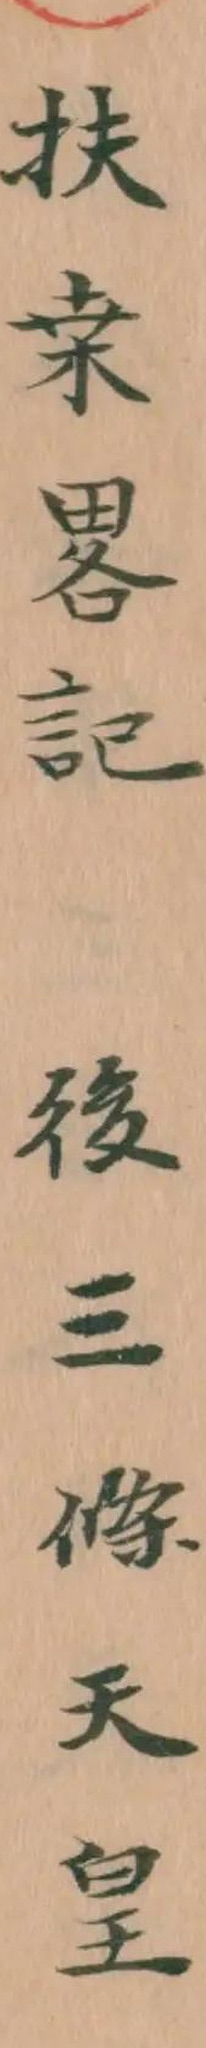○扶桑略記後三条天皇
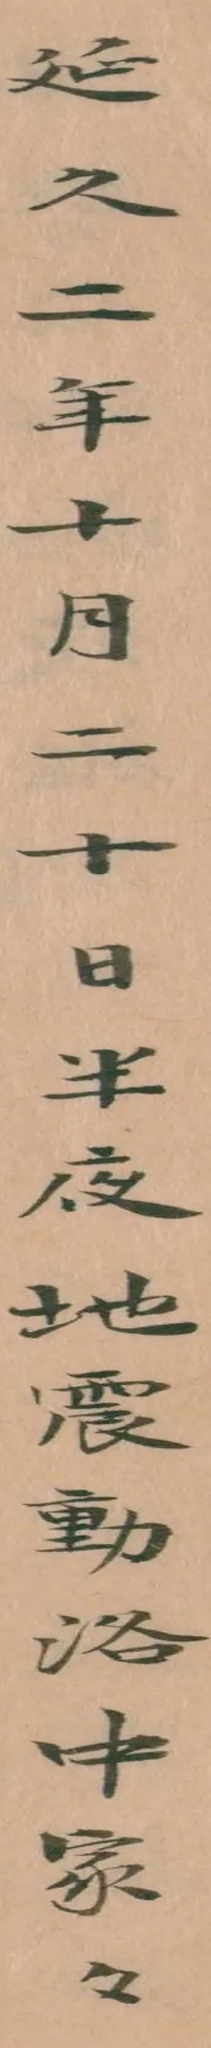延久二年十月二十日半夜地震動洛中家々
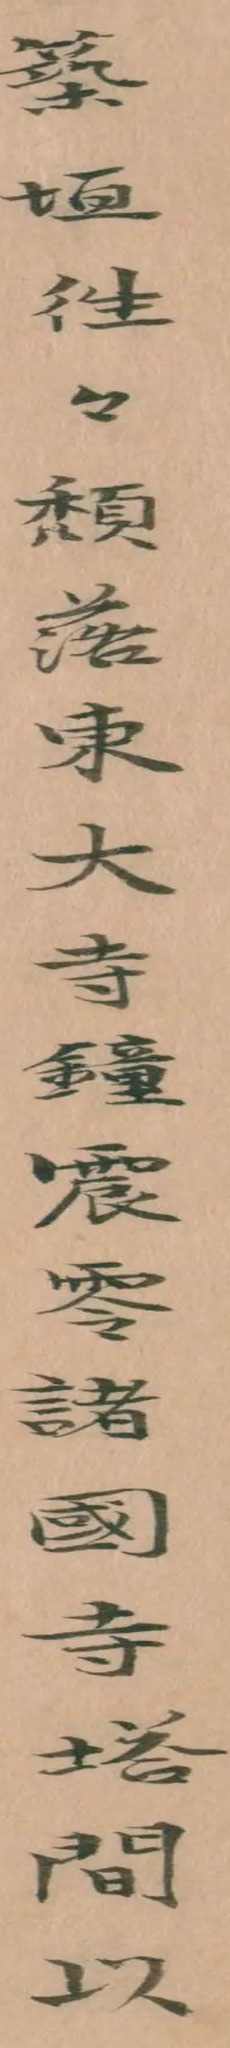築垣往々頽落東大寺鐘震零諸国寺塔間以
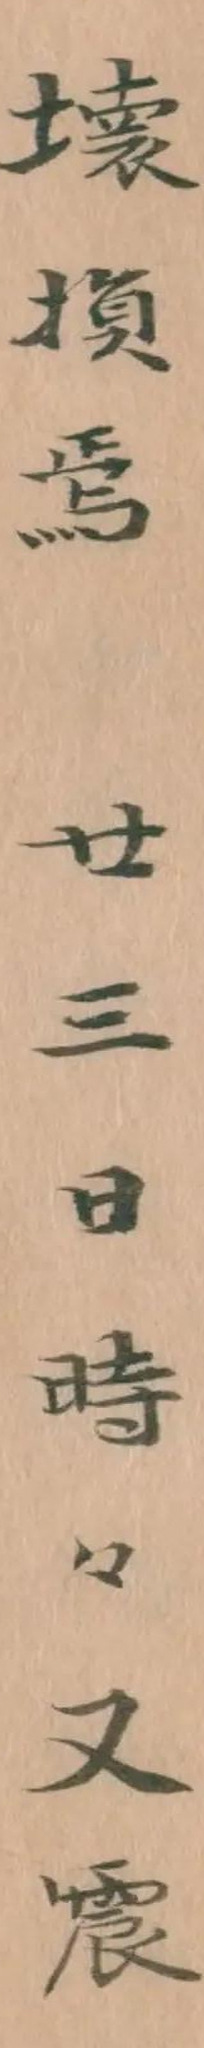壊損焉廿三日時々又震
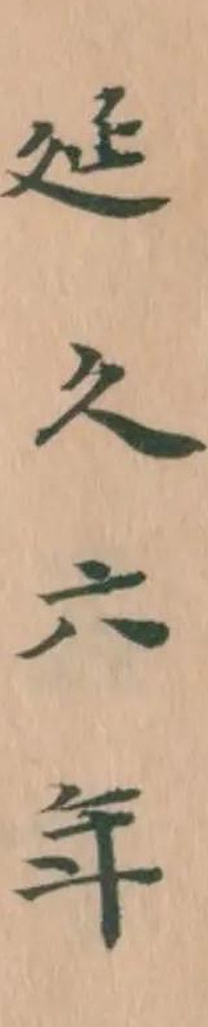延久六年
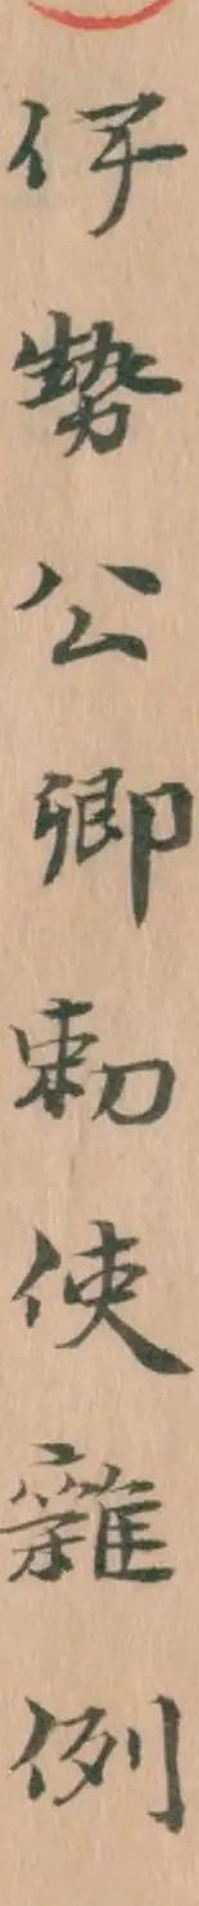○伊勢公卿勅使雑例
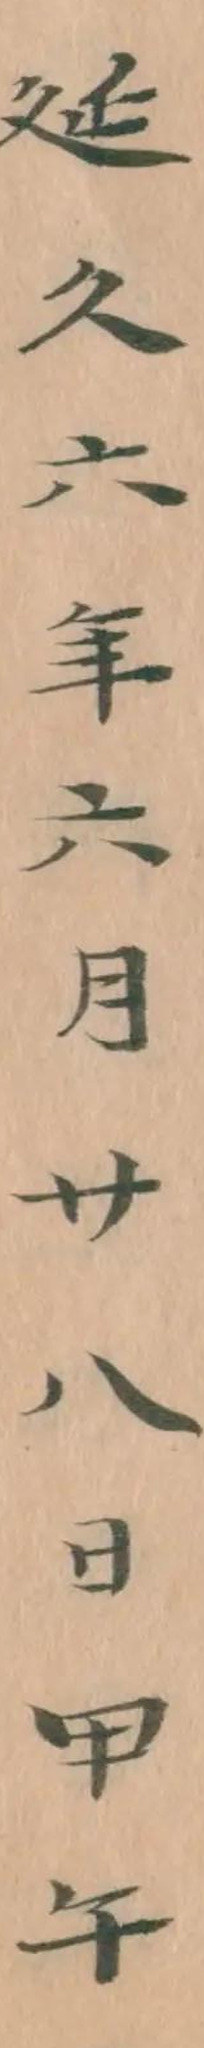延久六年六月廿八日甲午

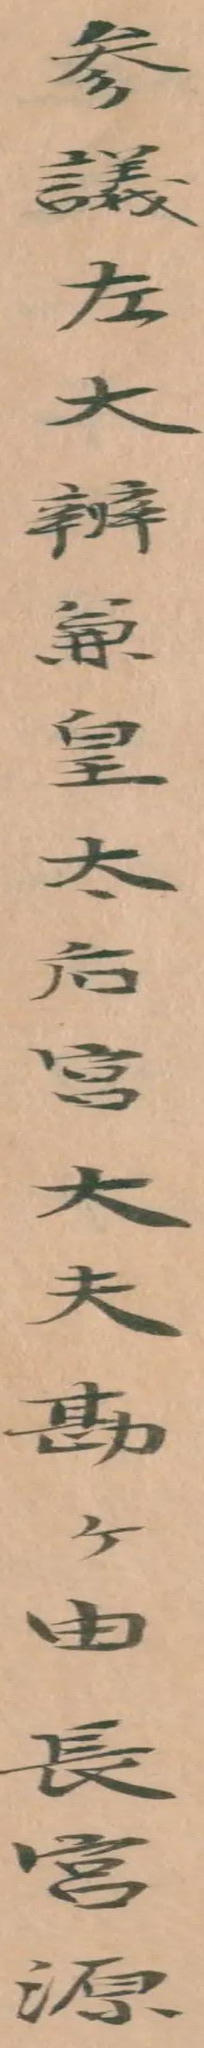参議左弁兼皇太后宮大夫勘ヶ由長宮源
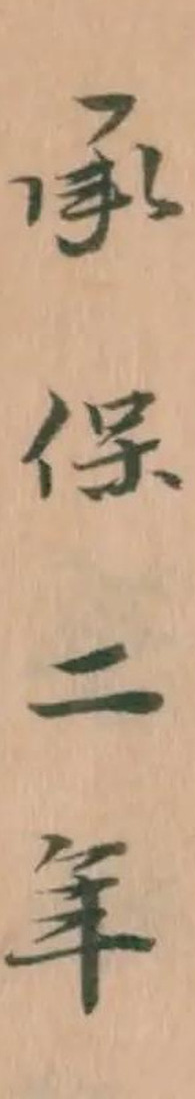承保二年
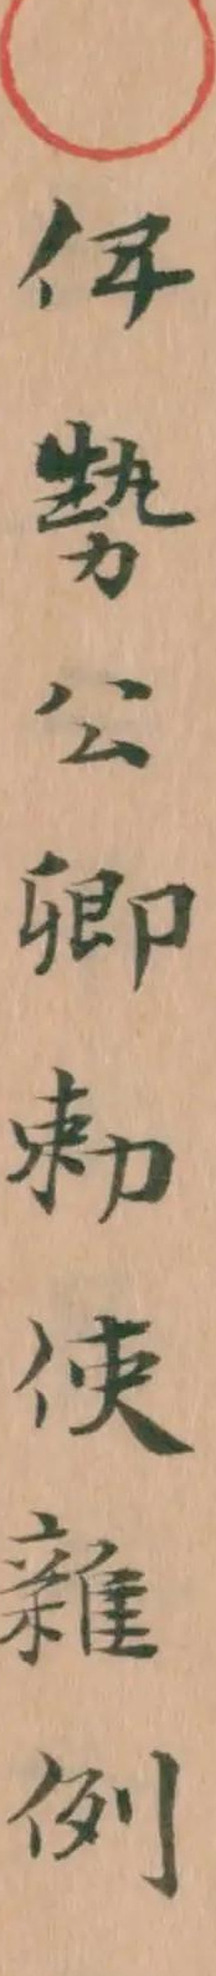○伊勢公卿勅使雑例
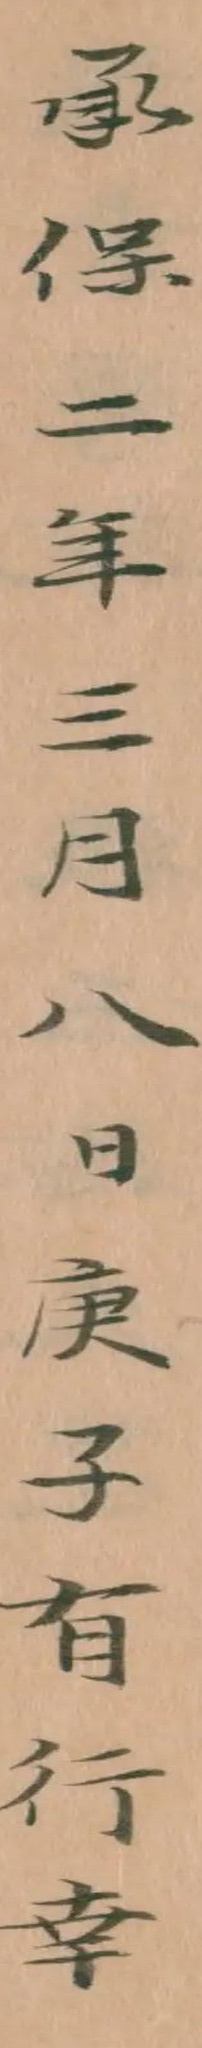承保二年三月八日庚子有行幸
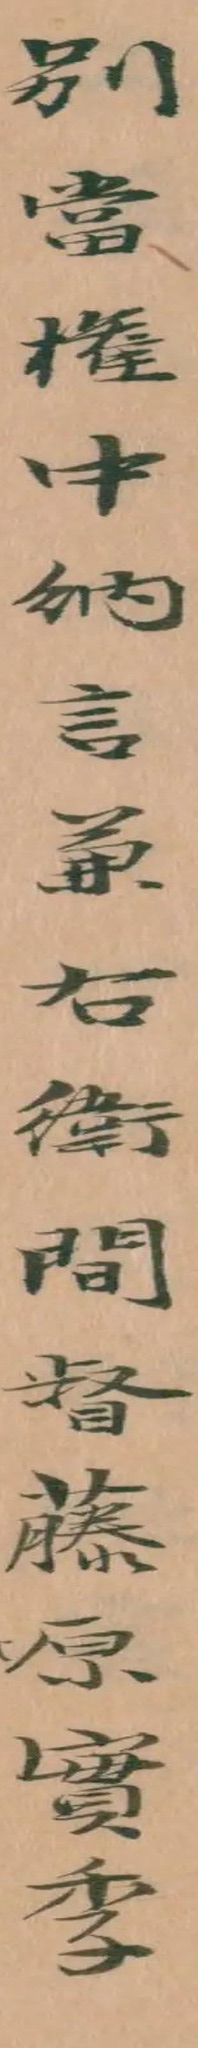別当権中納言兼右衛間督藤原実季
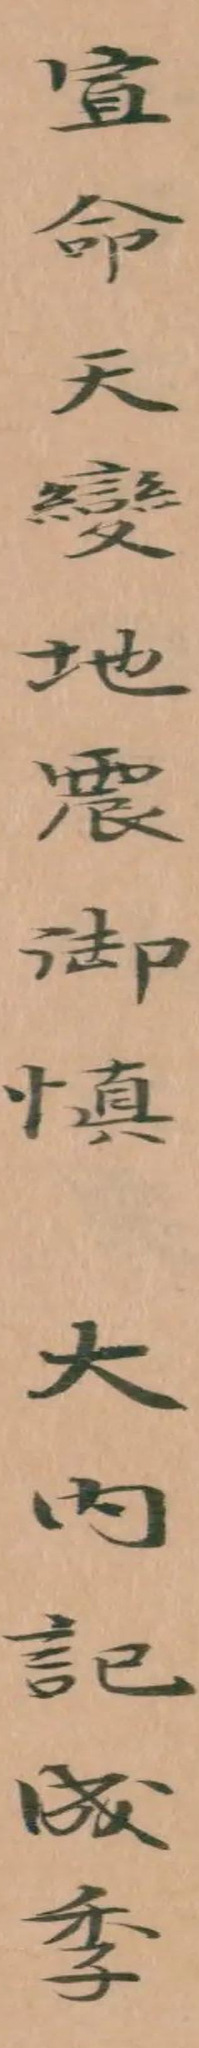宣命天変地震御慎大内記成季
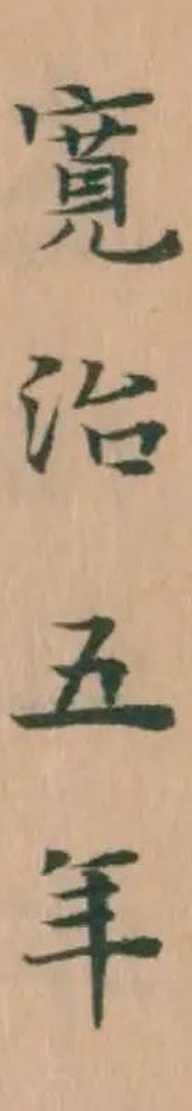寛治五年
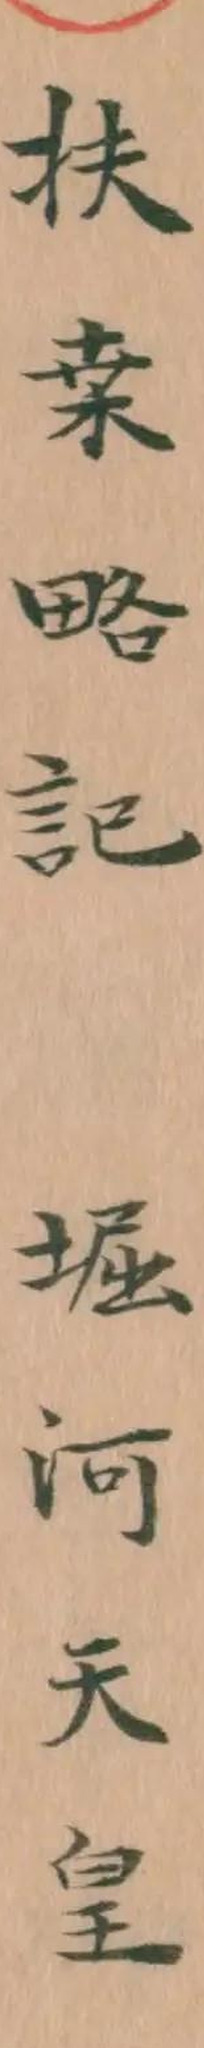○扶桑略記堀河天皇
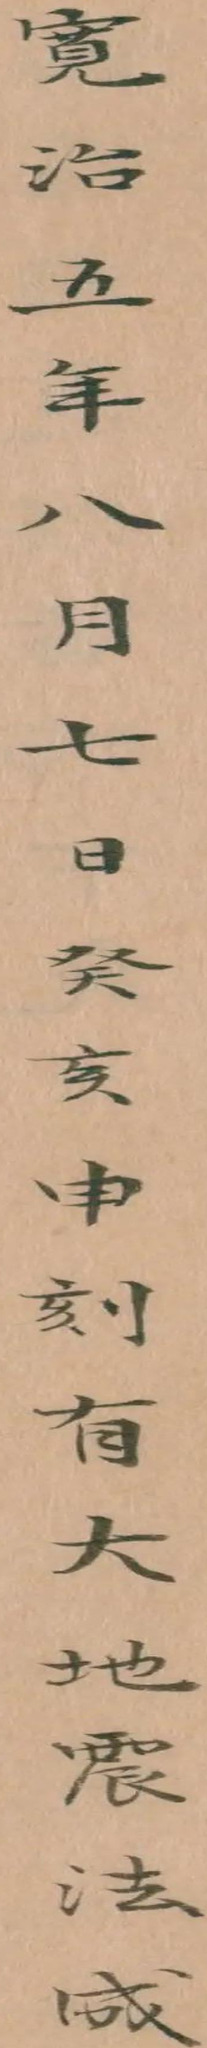寛治五年八月七日癸亥申刻有大地震法成
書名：地災撮要. 巻5-6(地震之部)
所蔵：国立国会図書館 National Diet Library, JAPAN
